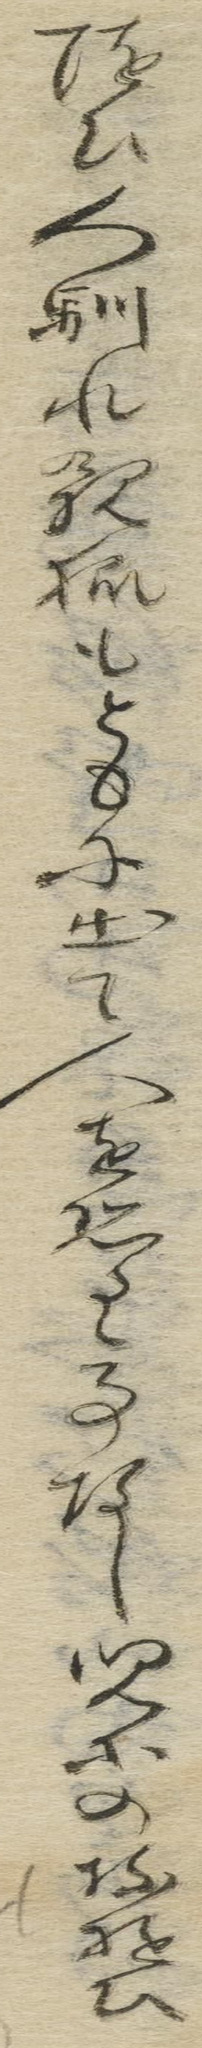随ひ人慣れ親狐もともに出て人を恐る事なし児等の致随ひ
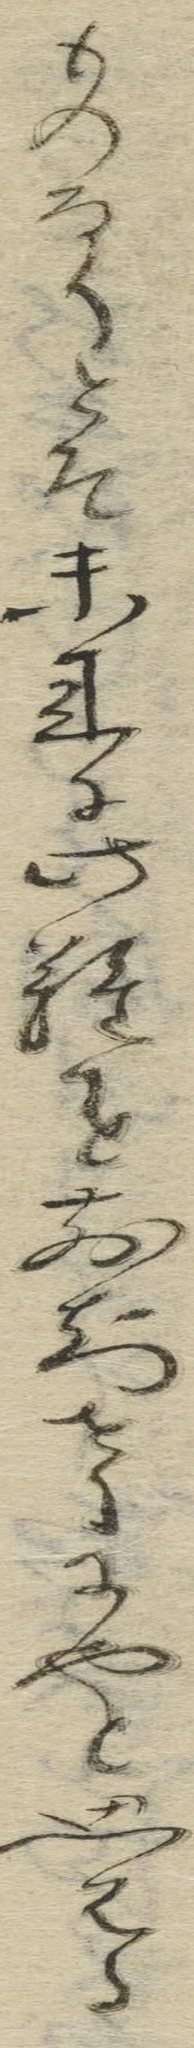ものなりとそ未年に此難を前知をりにやと思える
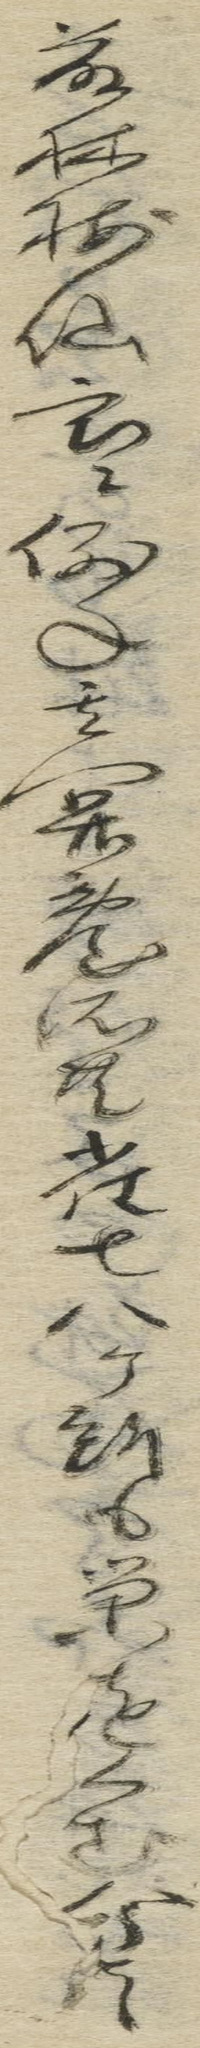藤林梅仙宅に例年其関臺所共雀七八ヶ所も巣をくむ今は
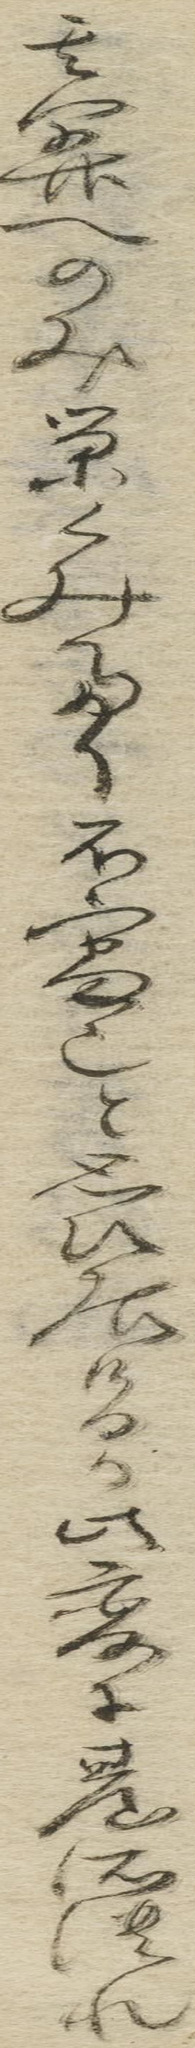其関へのみ巣くみたり不宮也と思ひ居けるか此変に臺所潰れ
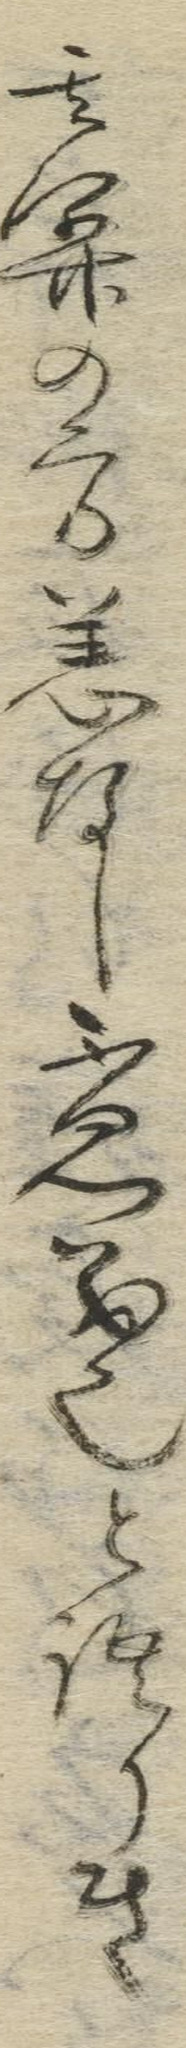其関の方恙なし不思義也と語りき
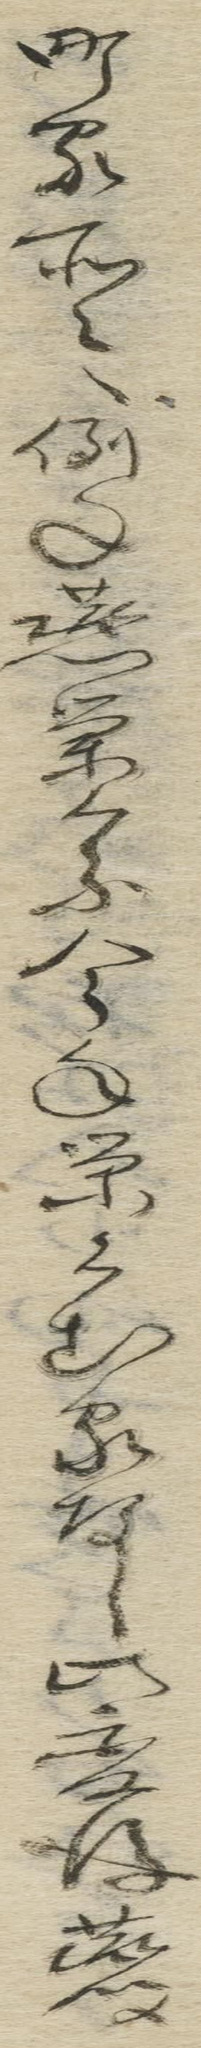町家所々へ例年燕巣くふ今年巣くむ家なし此変後燕メ
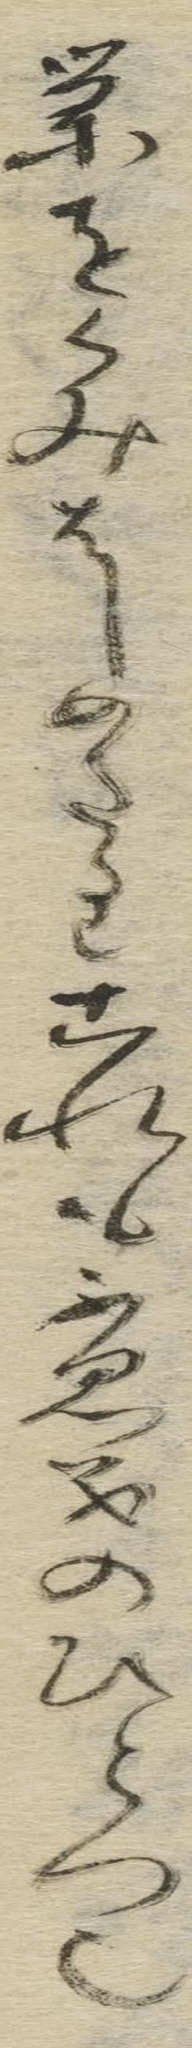巣をくみはしめたるわこれも不思義のひとつ也
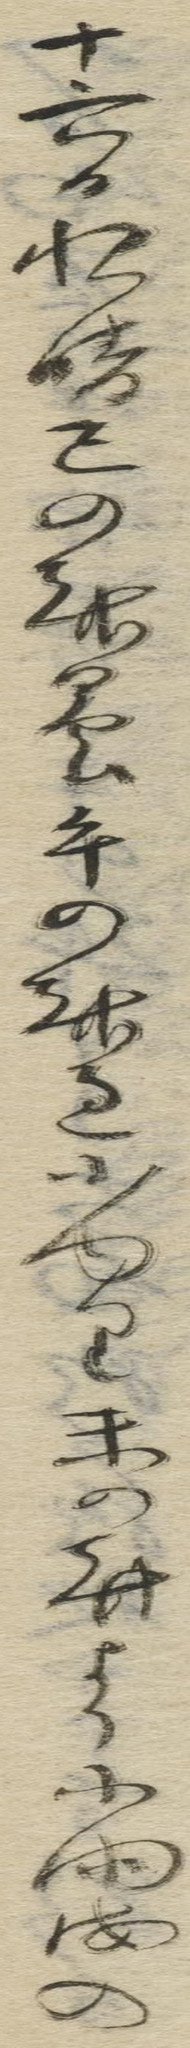十六日快晴巳の刻曇午の刻過小ゆり未の刻より小雨戌の
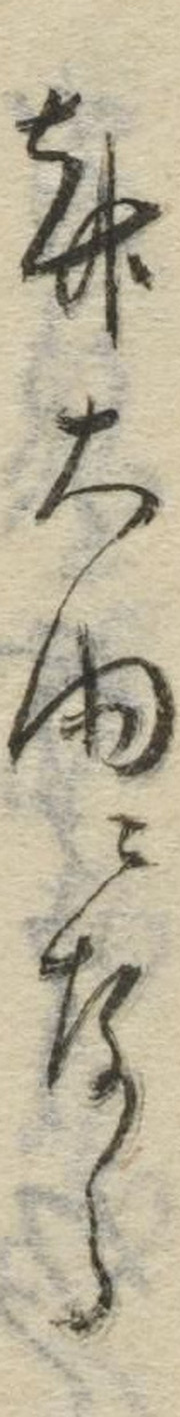刻大雨二なる
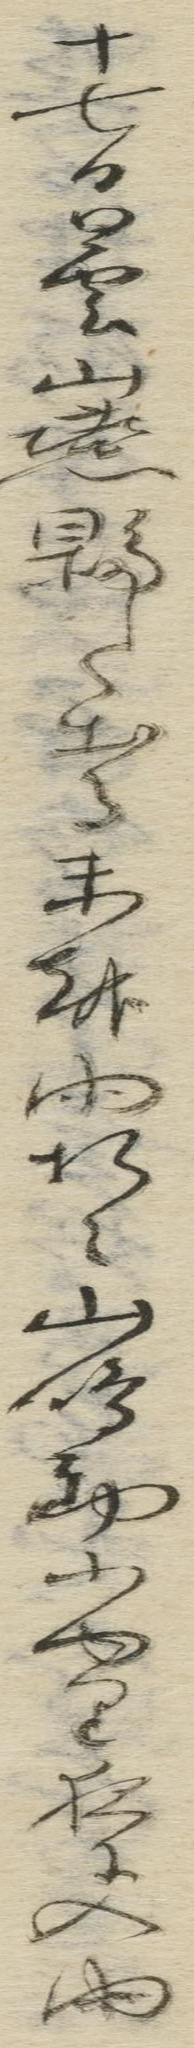十七日曇山燕夥しく出る未刻雨折々山鳴動小ゆり夜に入雨
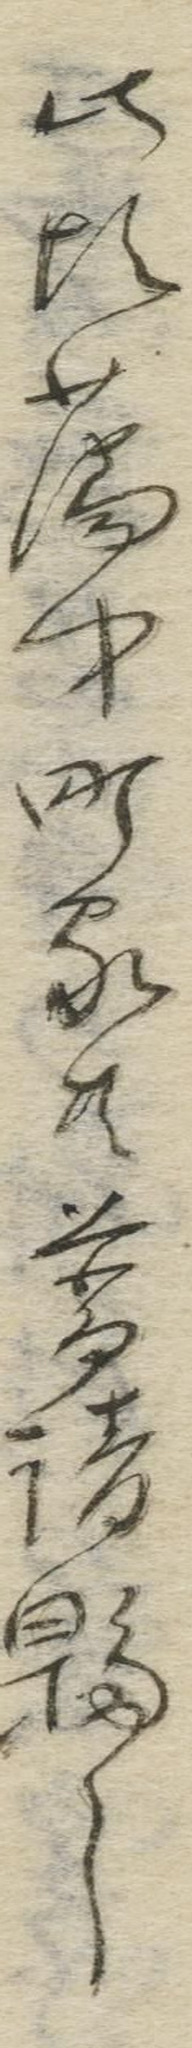此頃藩中町家共普請夥し
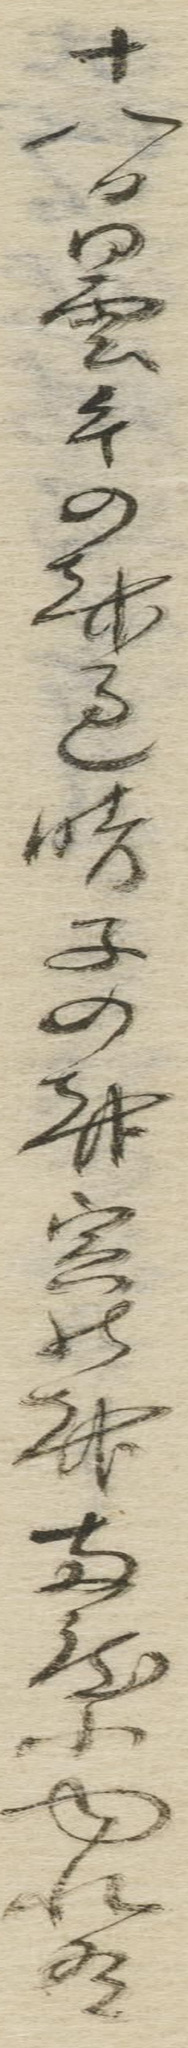十八日曇午の刻過晴子の刻寅の刻両度小ゆれ有
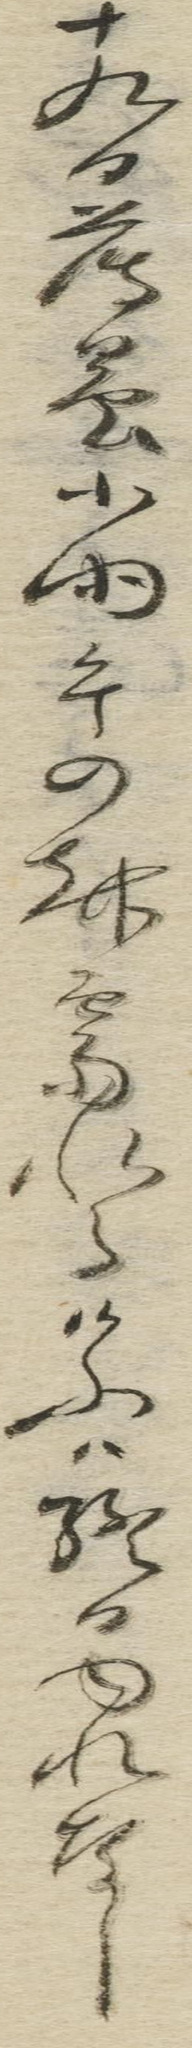十九日薄曇小雨午の刻霽れるけふハ終日ゆれなし
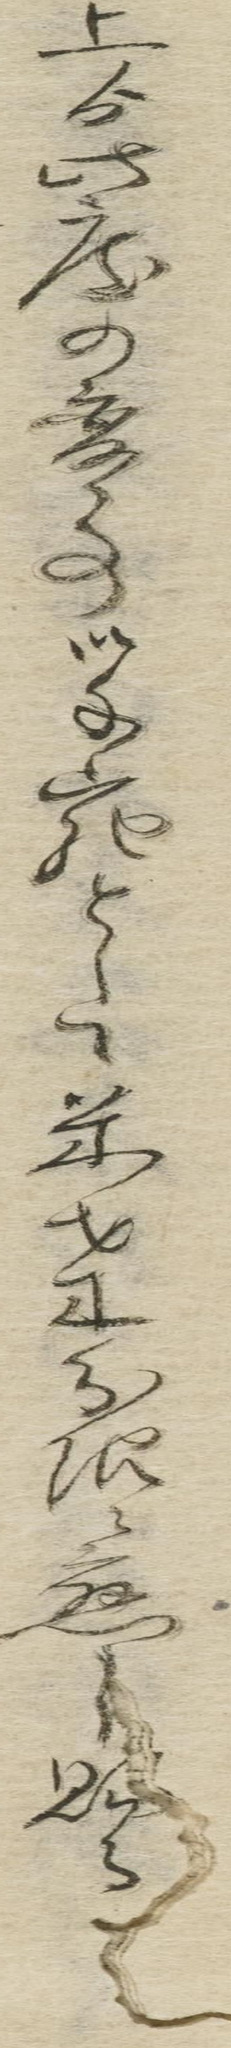上ゟ此度の変事御手宛として米才木分限二応し賜る
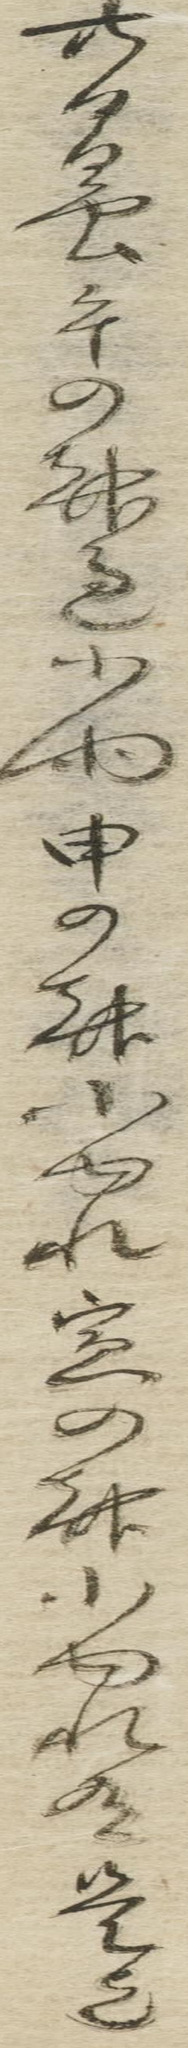廿日曇午の刻過小雨申の刻小ゆれ寅の刻小ゆれ有是迄
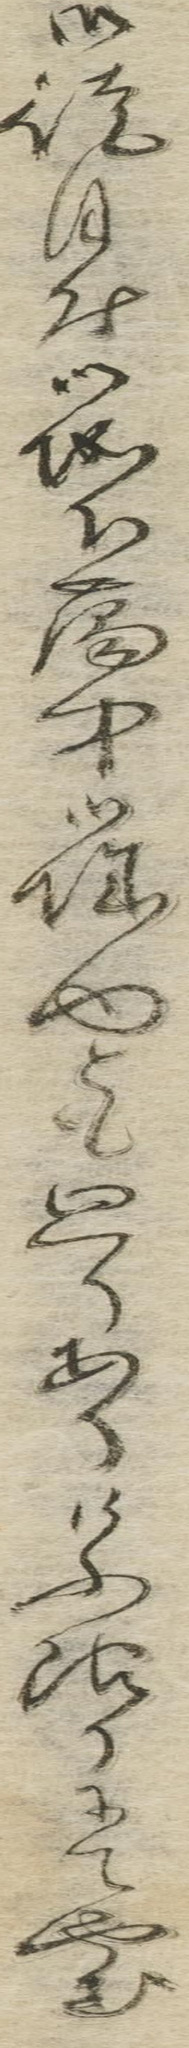御徒目付御城下藩中御城内とも廻りありけふ限りにてやむ
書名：弘化丁未天變日記
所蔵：東京大学地震研究所図書室 Earthquake Research Institute Library, The University of Tokyo, JAPAN
